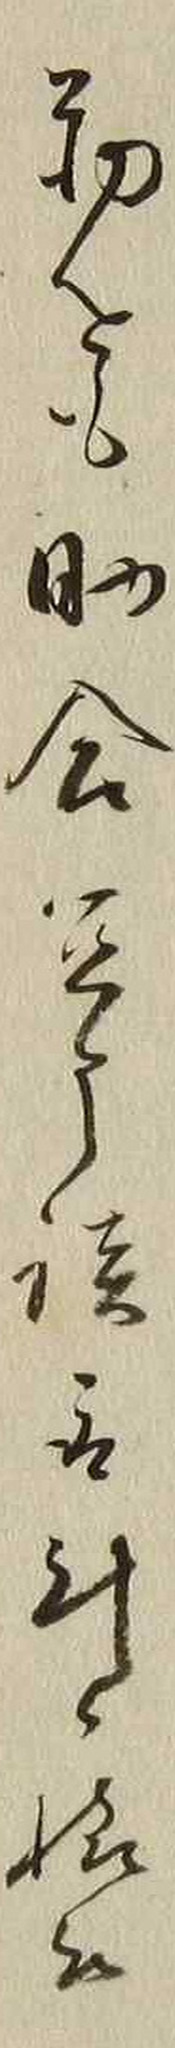勤をも助合宜申談被取計候様被
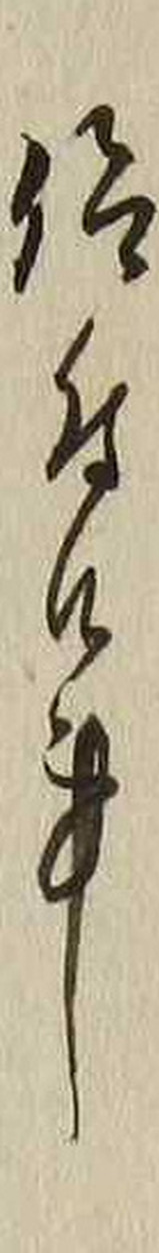仰付候事
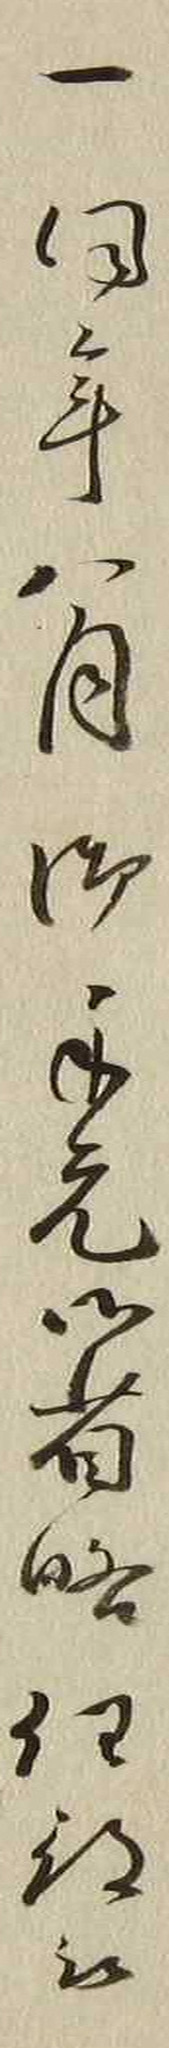一同年八月御手元御省略任役被
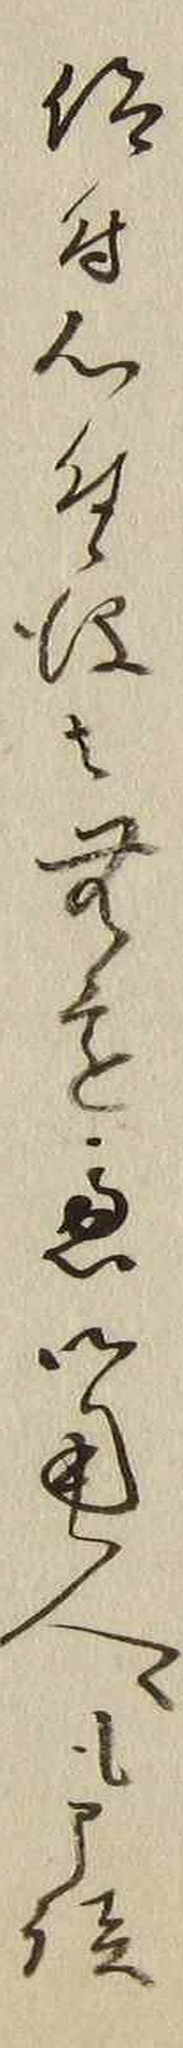仰付心付候儀者無遠慮御用人へも申談
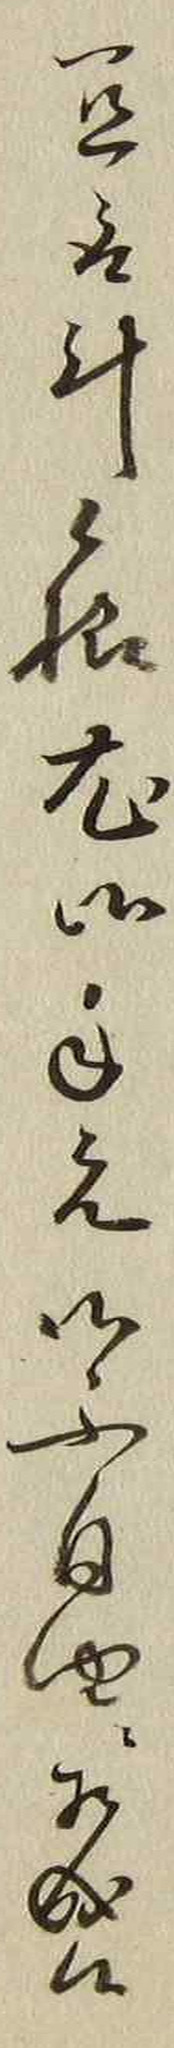宜取計候様尤御手元御不自由ニ相成候
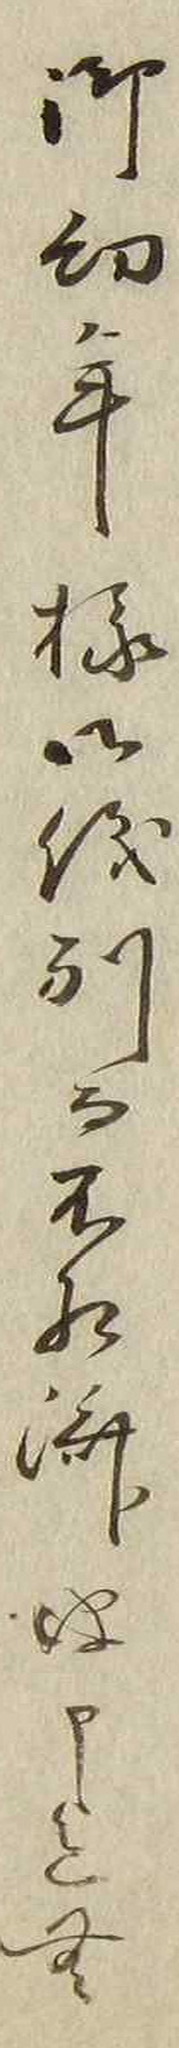御幼年様御儀別而不相済儀申迄無
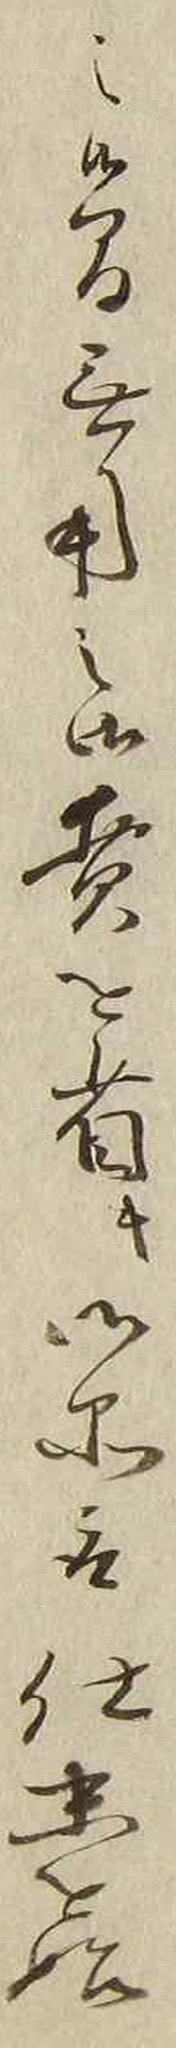之候間無用之御費を省キ御品取仕末を始

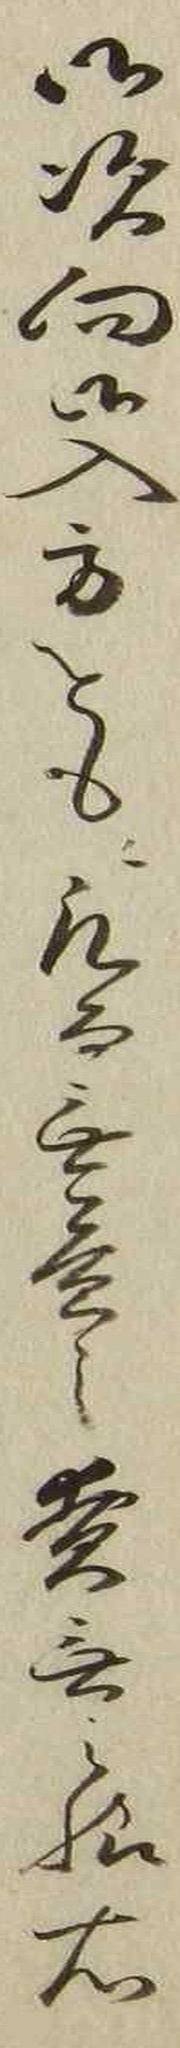御次向御入方ともニ凡而無益之費無之様右
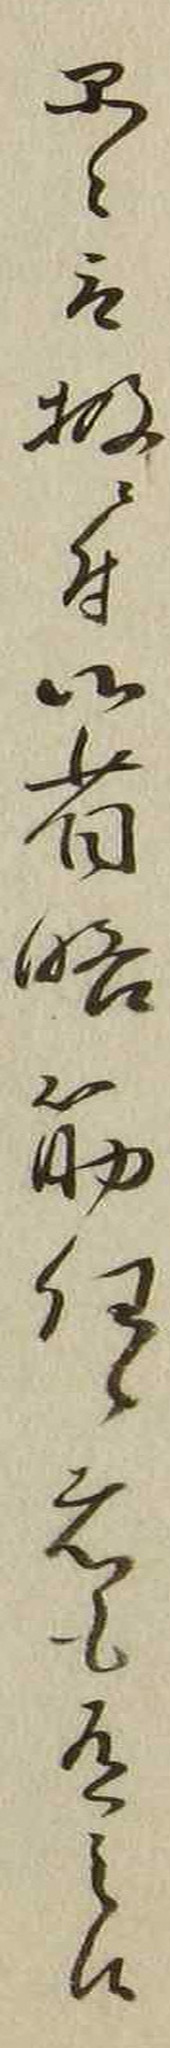品々取扱ニ付御省略筋任候者も有之候
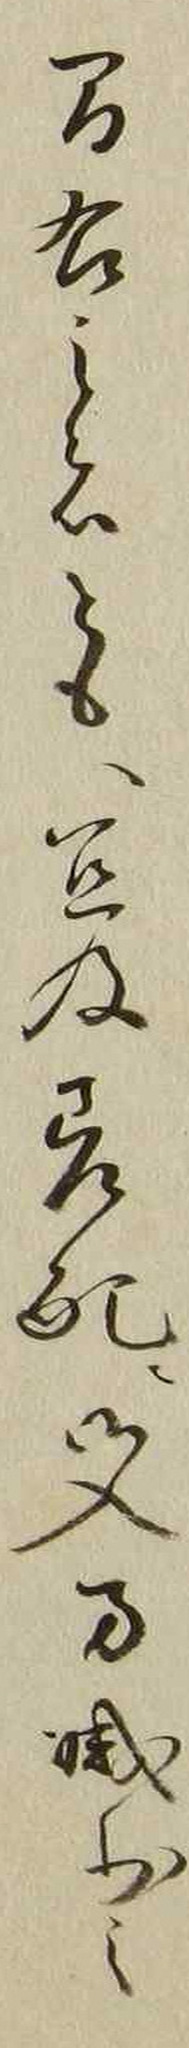間右之者ともへ宜及差配ニ御入方減少之
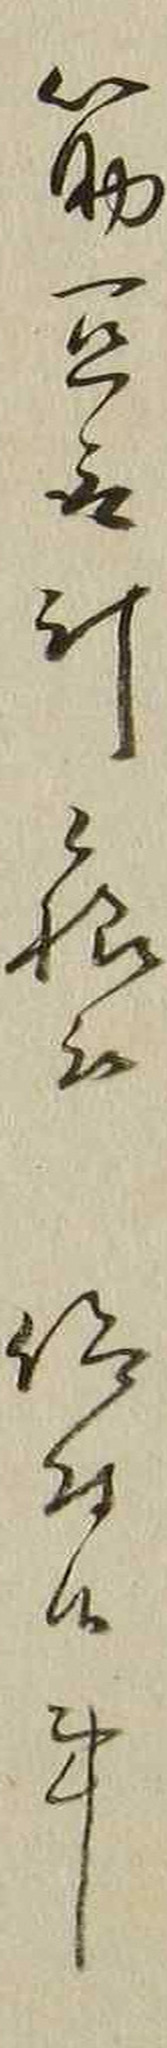筋宜取計候様被仰付候事
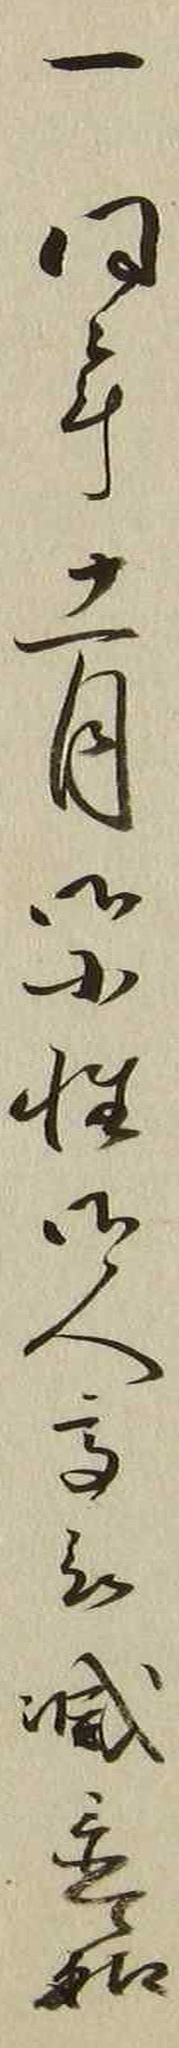一同年十一月御小性御人高被減置候様
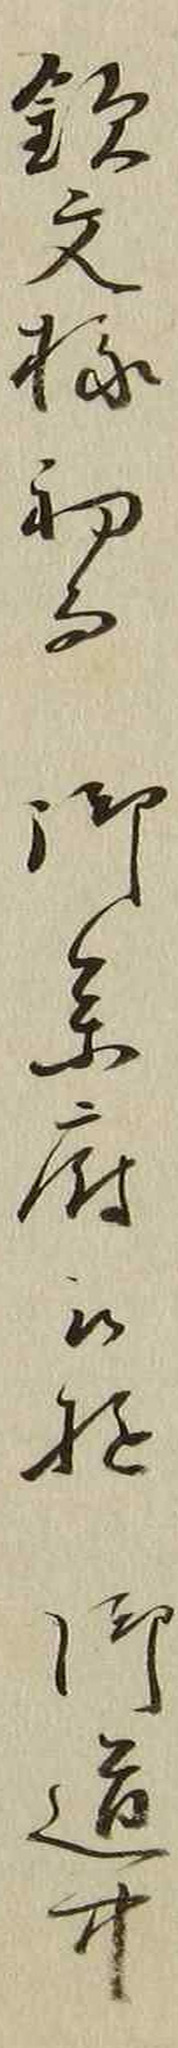欽文様初而御参府被遊御道中
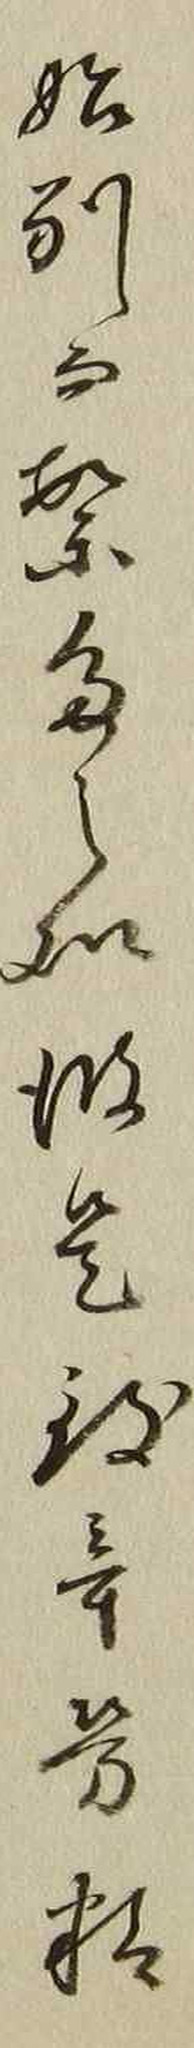始別而繁多之処彼是致辛労精
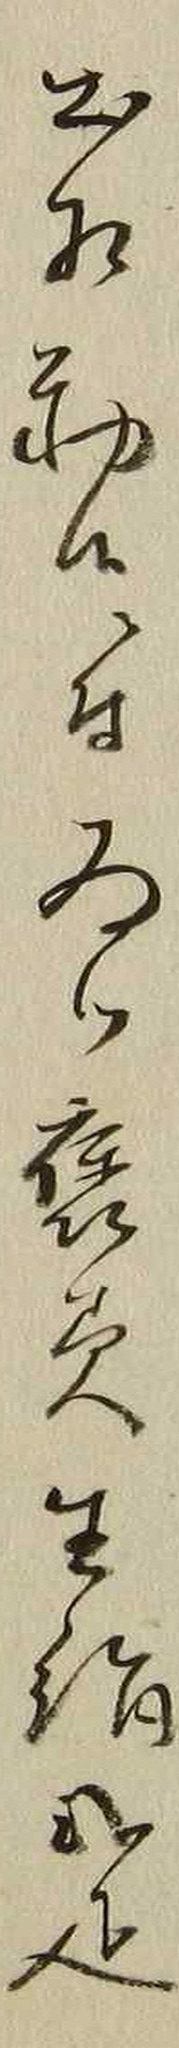出相勤候ニ付為御褒美生絹弐疋
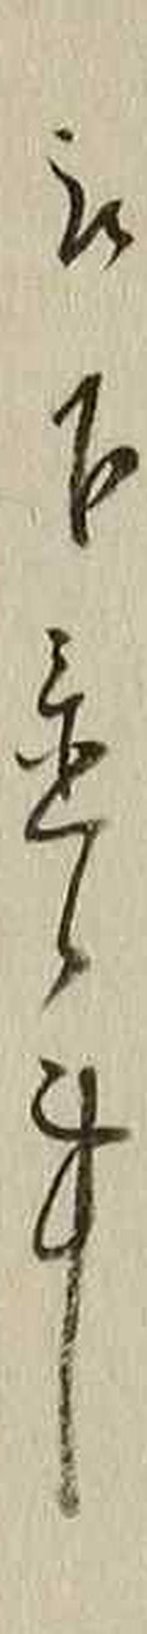被下置候事
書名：諸士系譜　巻之25　い之部25
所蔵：会津若松市立会津図書館
